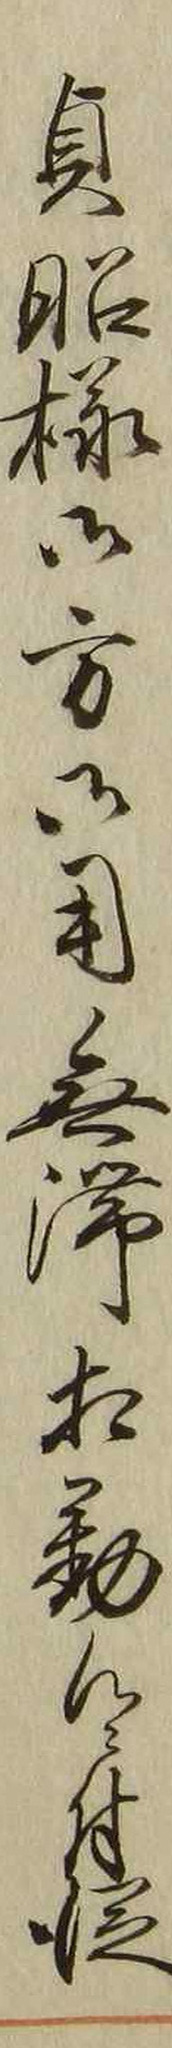貞昭様御方御用無滞相勤候ニ付従
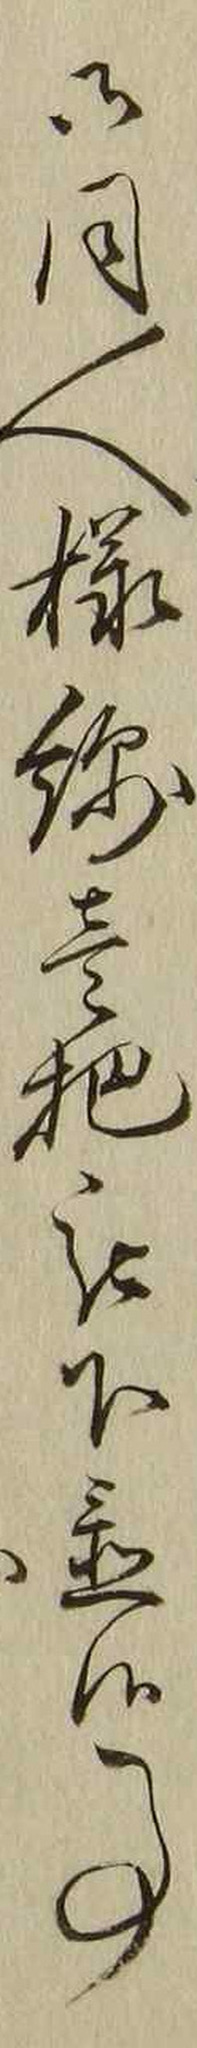御同人様綿壱把被下置候事
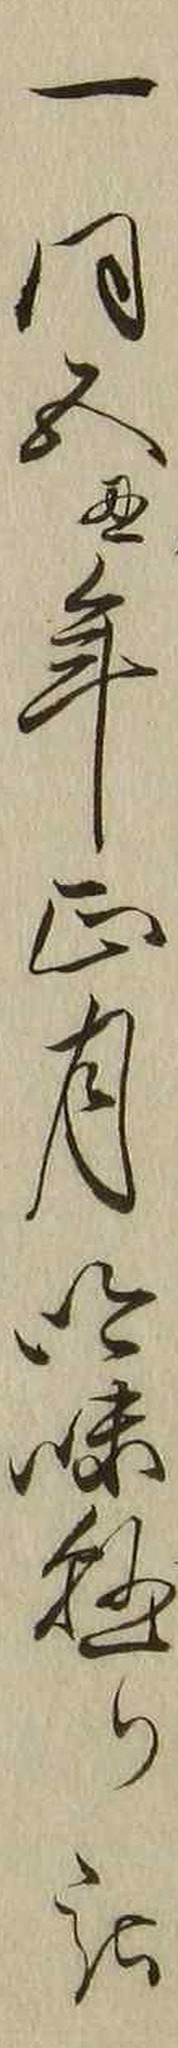一同五丑年正月吟味懸り被
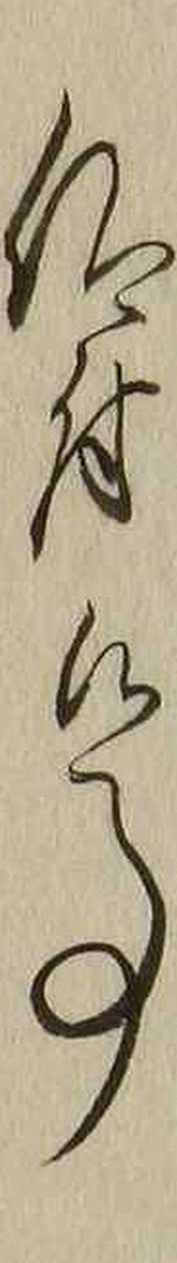仰付候事
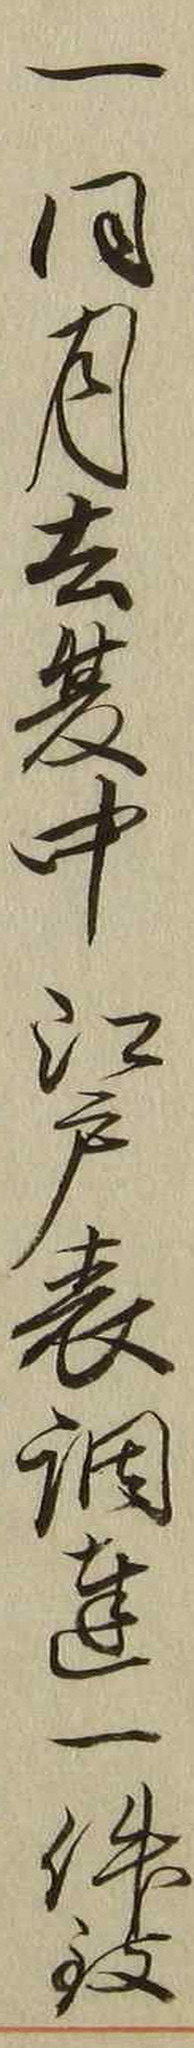一同月去夏中江戸表調達一件致
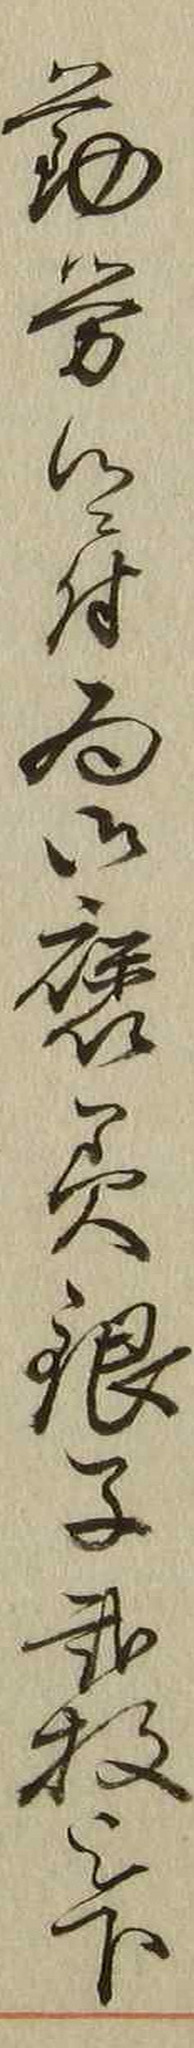勤労候ニ付為御褒美銀子弐枚被下
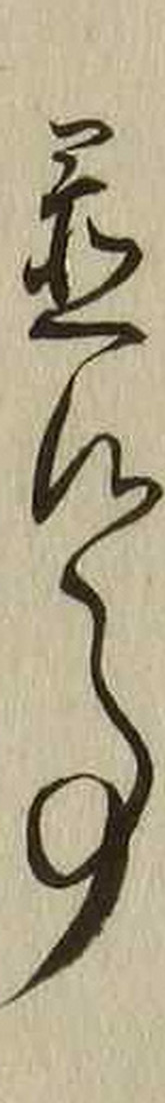置候事
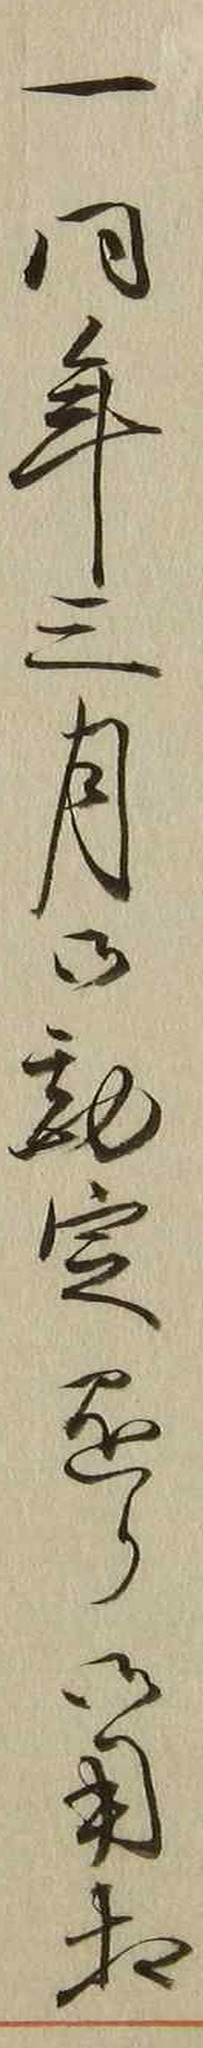一同年三月御勘定懸り御用相
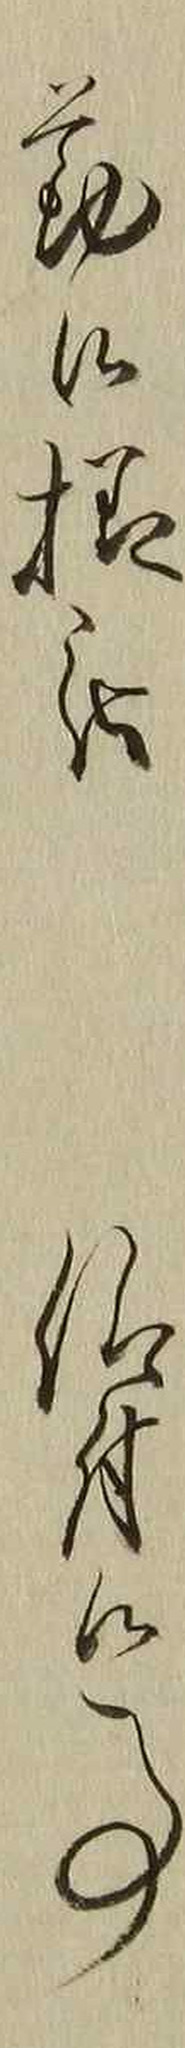勤候様被仰付候事
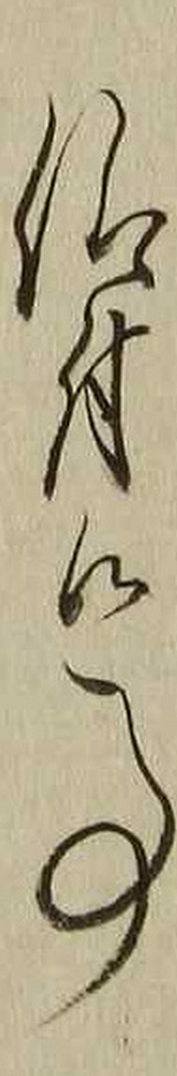仰付候事
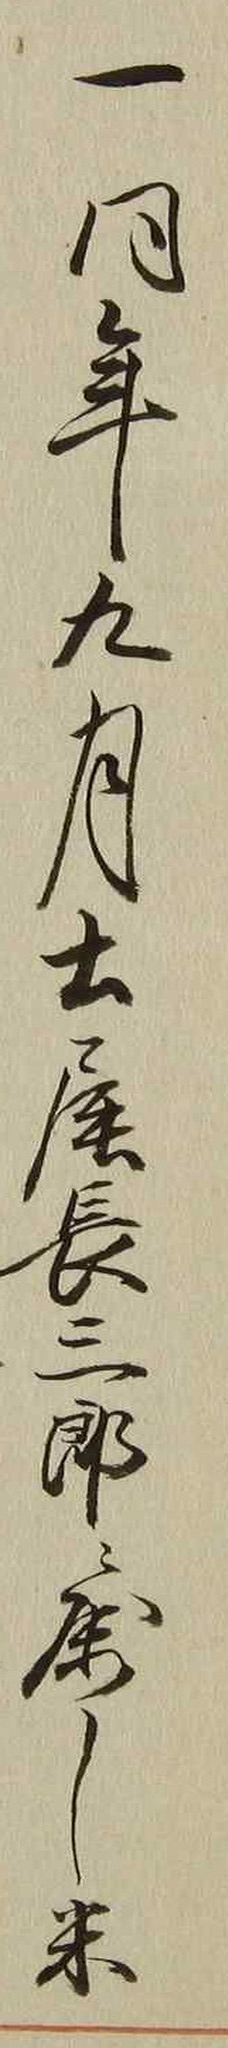一同年九月土屋長三郎ニ属し米
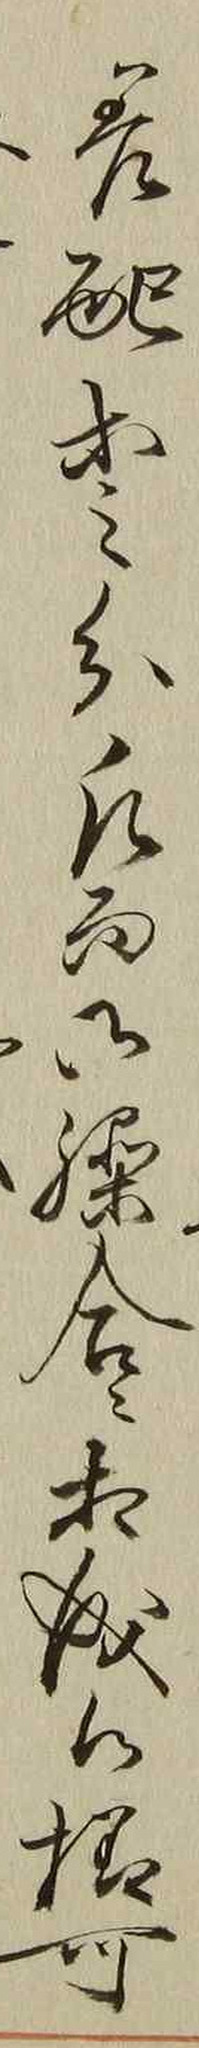差配等之分凡而御繰合ニ相成候様可
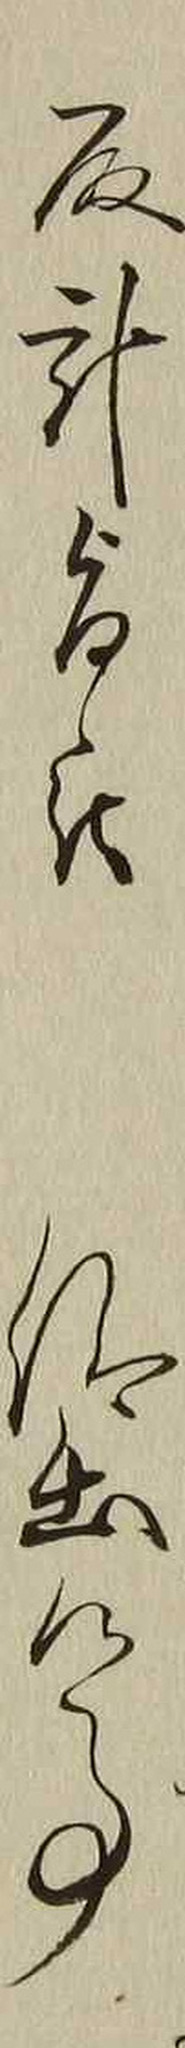取計旨被仰出候事
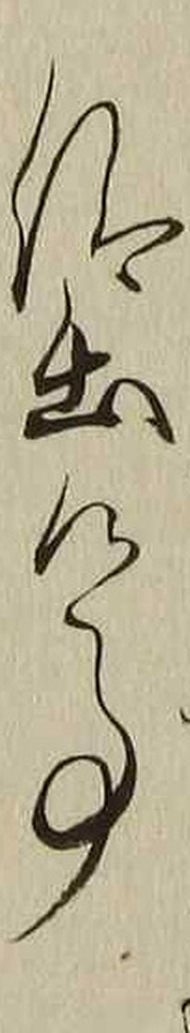仰付候事
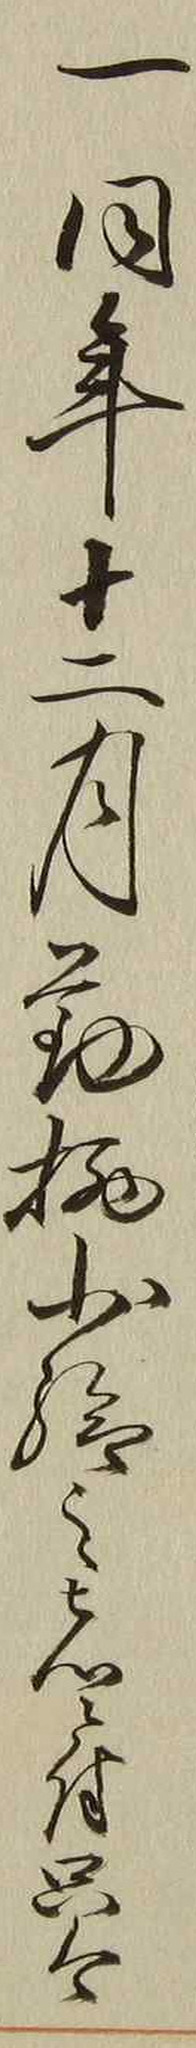一同年十二月勤柄少給之者ニ付只今
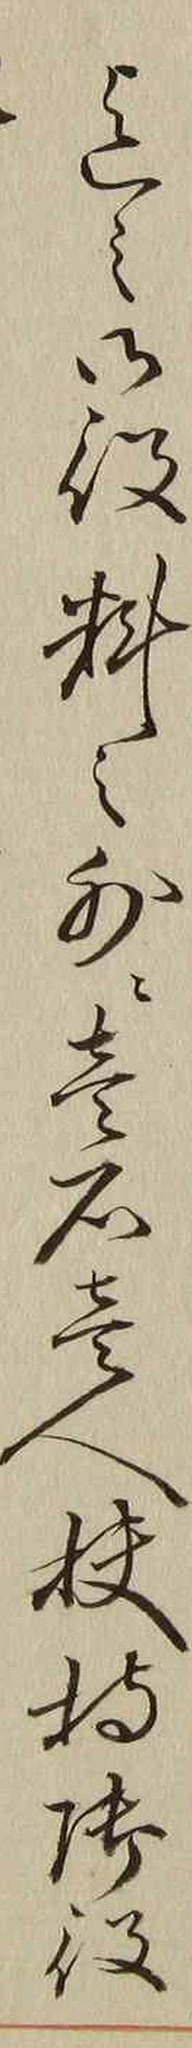迄之御役料之外ニ壱石壱人扶持御役
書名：諸士系譜　巻之57　ほ之部4
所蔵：会津若松市立会津図書館
